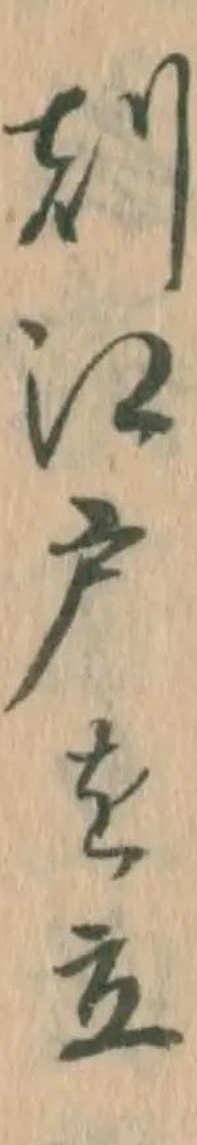刻江戸を立
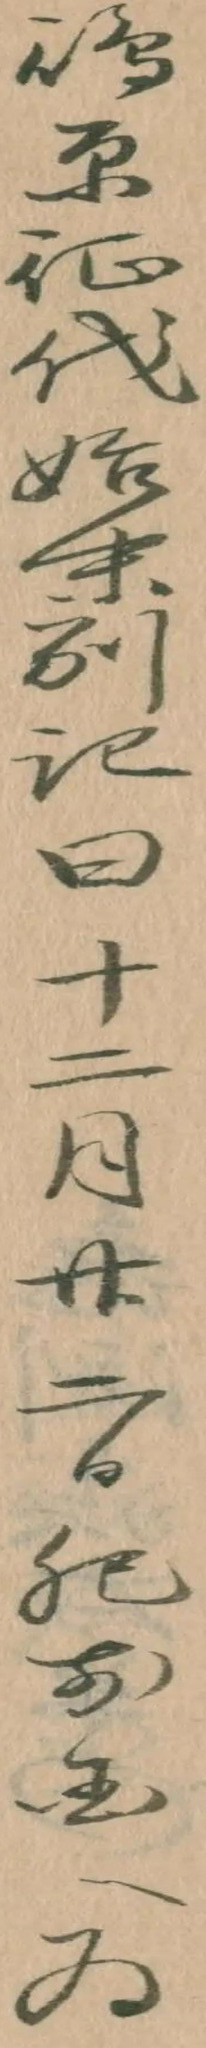島原征伐始末別記曰十二月廿二日肥前国へゐ
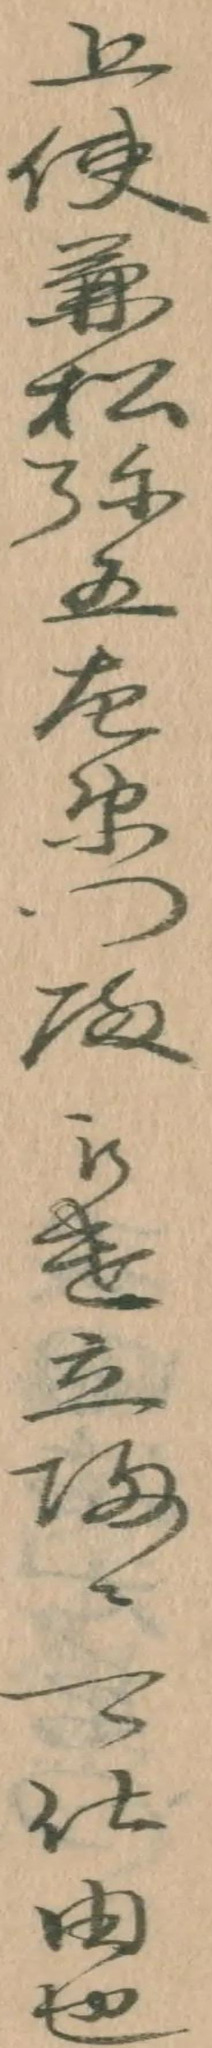上使兼松弥五左衛門殿被遣立帰に可仕由也
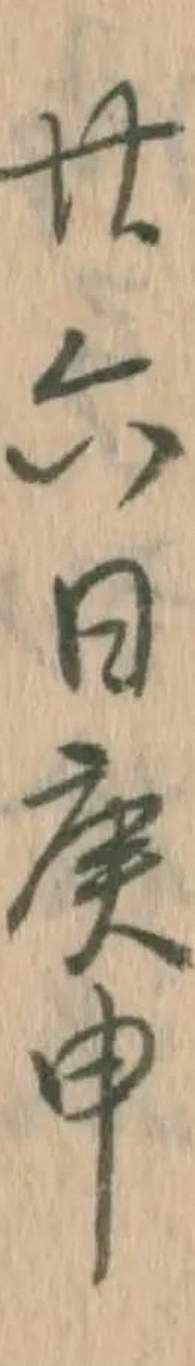廿六日庚申
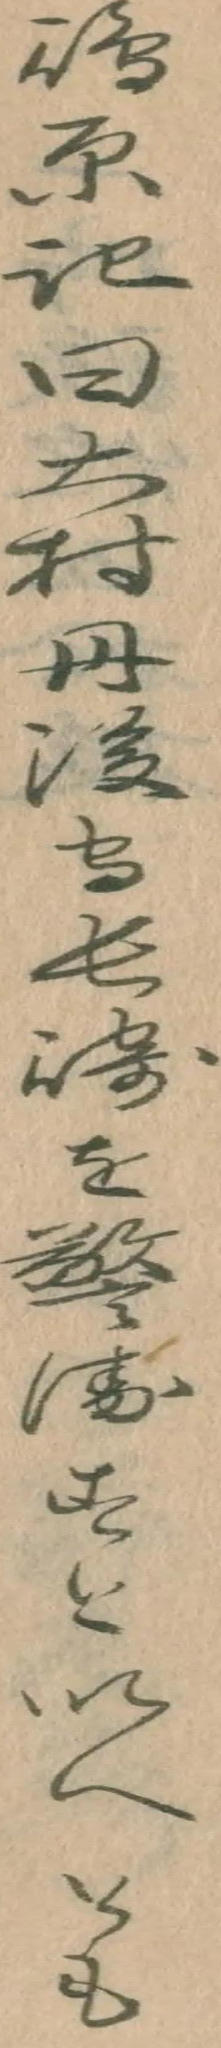島原記曰大村丹後守長崎を警衛春と以へとも
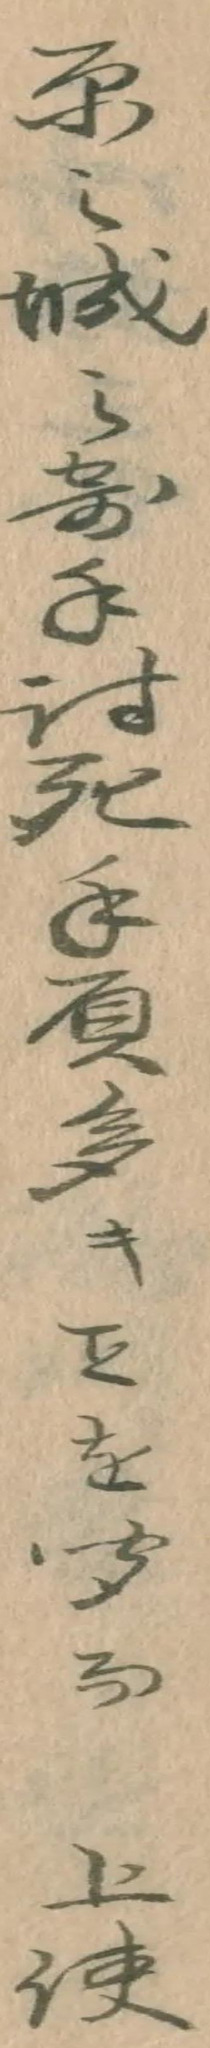原之城之寄手討死手負多き事を聞而上使
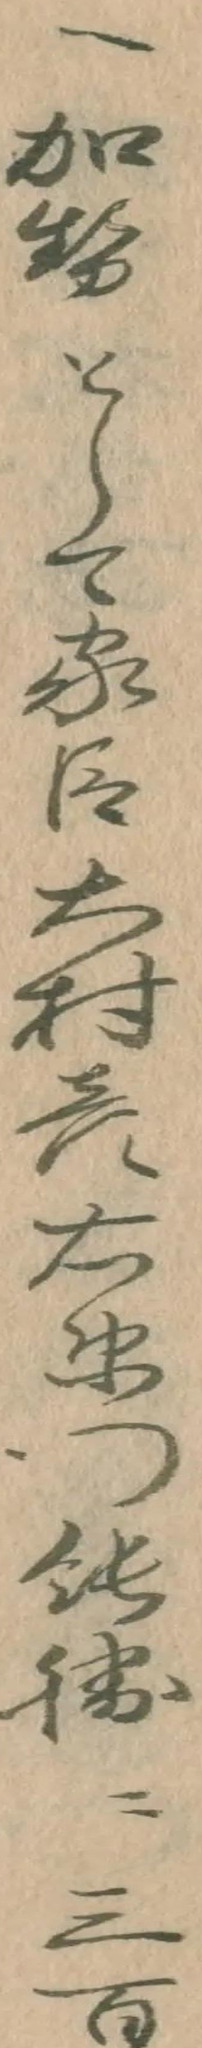へ加勢として家臣大村彦右衛門純勝に三百
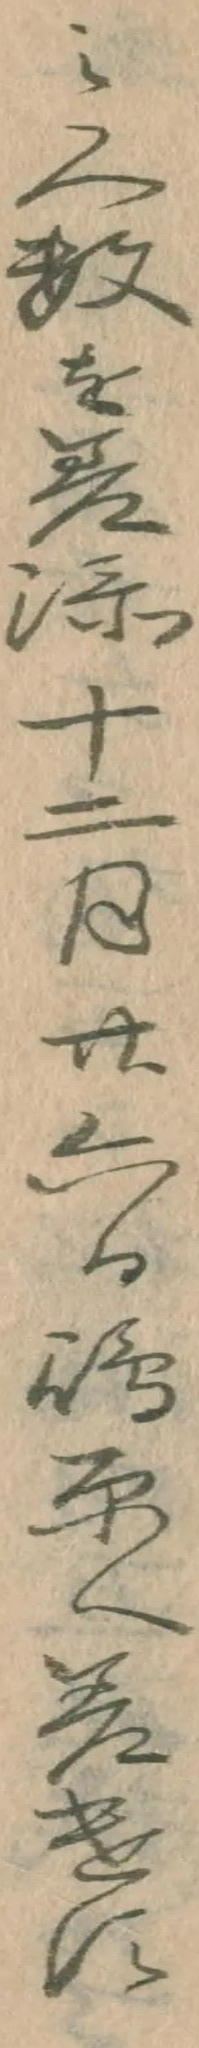之人数を差添十二月廿六日島原へ差遣須
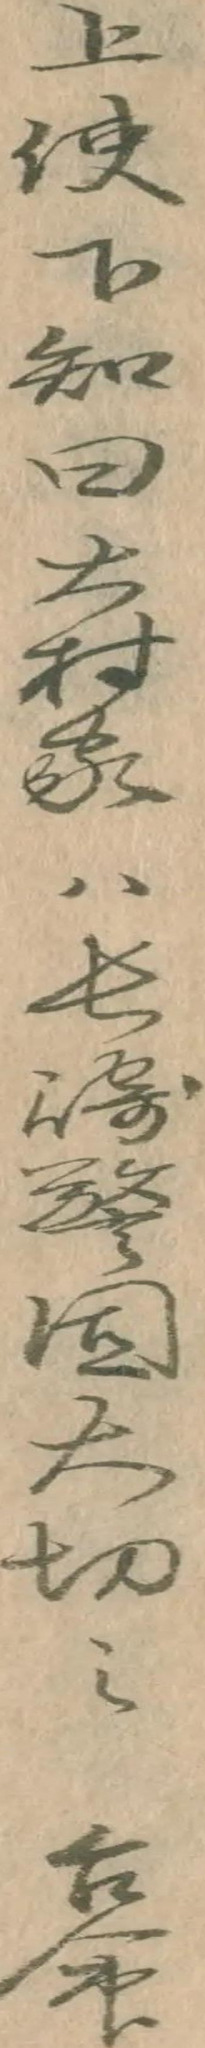上使下知曰大村家は長崎警固大切之召命
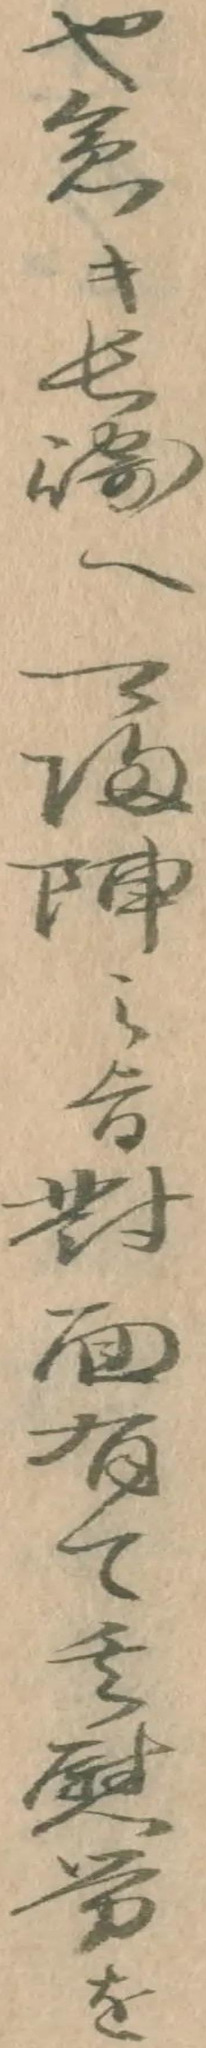や急き長崎へ可帰陣之旨対面有て其慰労を

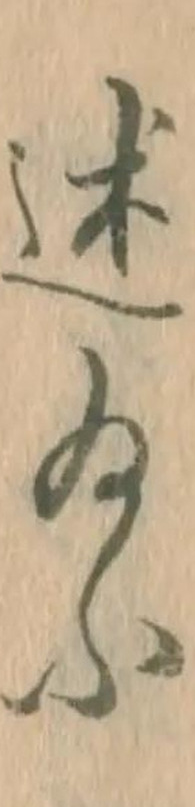述ゐふ
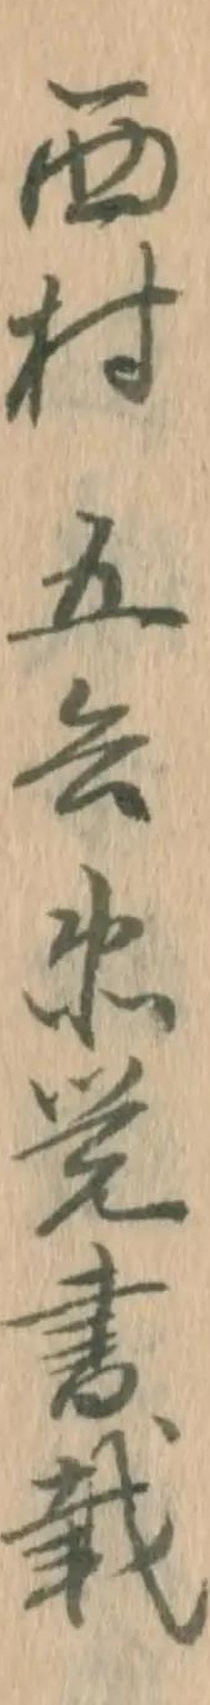西村五兵衛覚書載
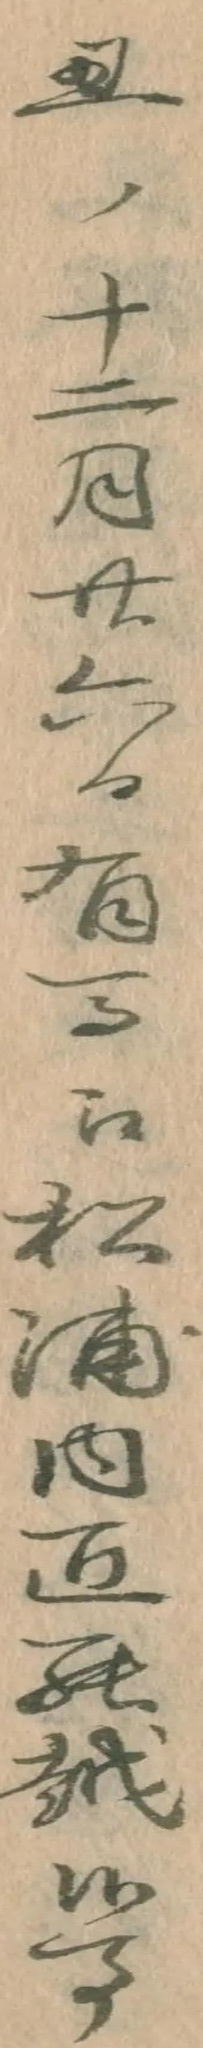丑之十二月廿六日有馬江松浦内匠罷越候事
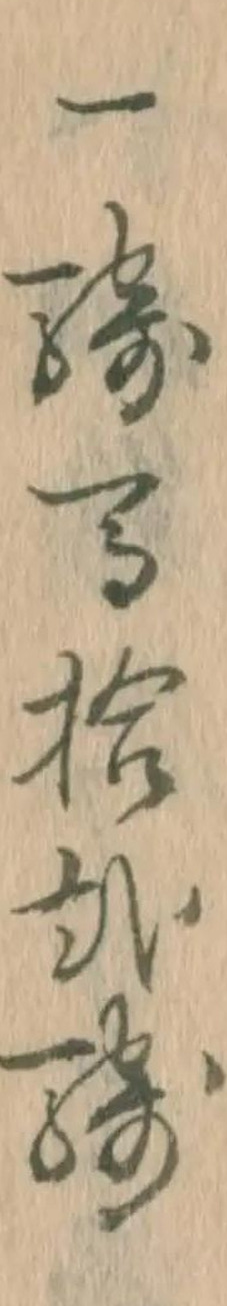一騎馬拾弐騎
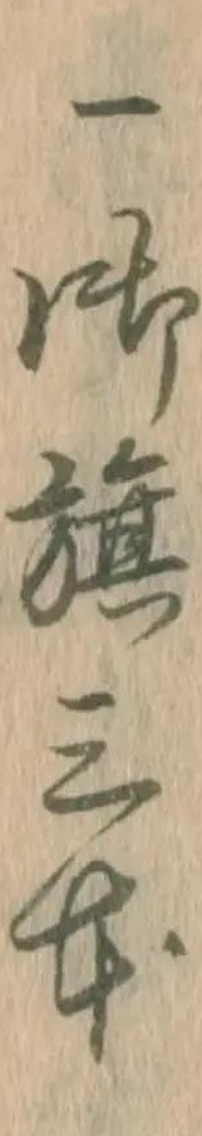一御旗三本
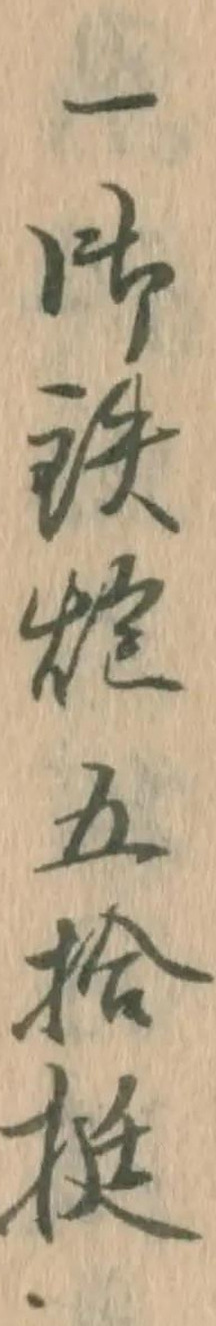一御鉄炮五拾挺
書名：切支丹御退治記 49巻. [4]
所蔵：国立国会図書館 National Diet Library, JAPAN
